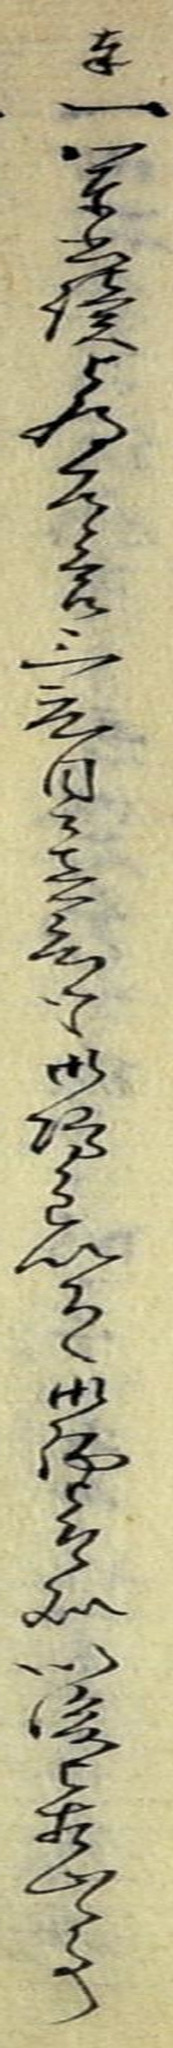奉一軍書読被為召候節三度目に壱度つヽ御坊主以可へ御酒被下候処以後被相止候事
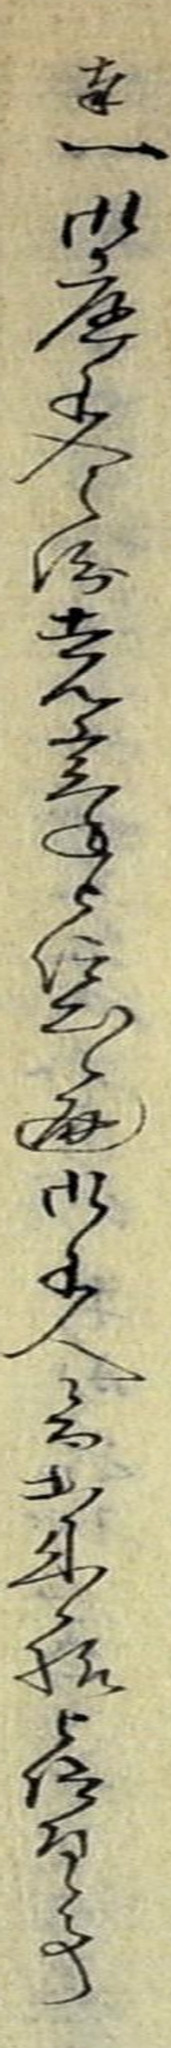奉一御庭手入之儀去ル亥年被仰出候通御手人に而出来候様被仰付候事
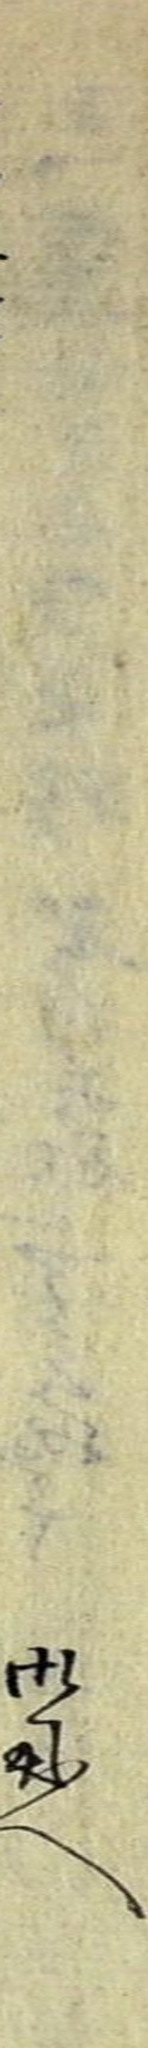御用人
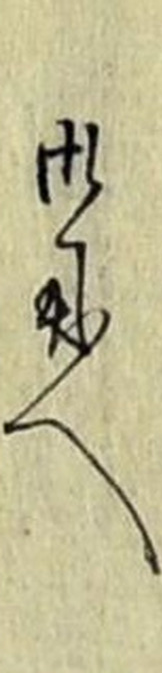御用人
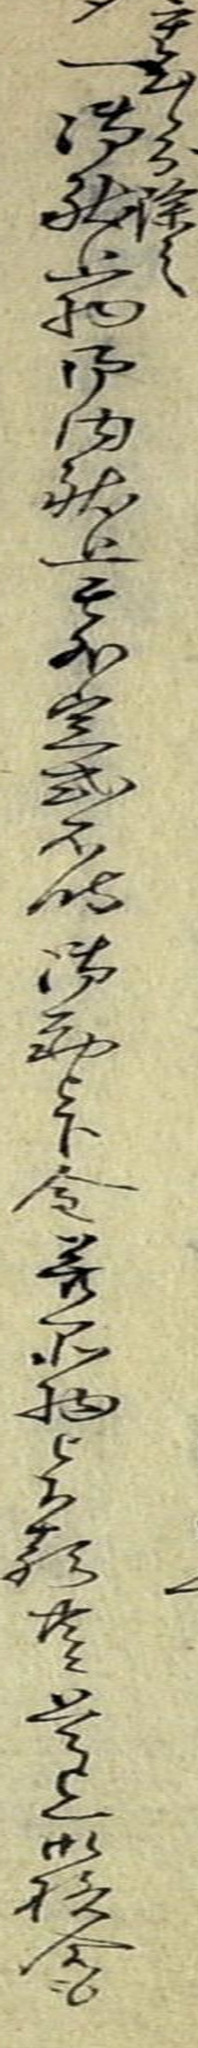聞一御献上物御内献上其外定式不時御勤被下金并品物被下類共に是迄御格合も
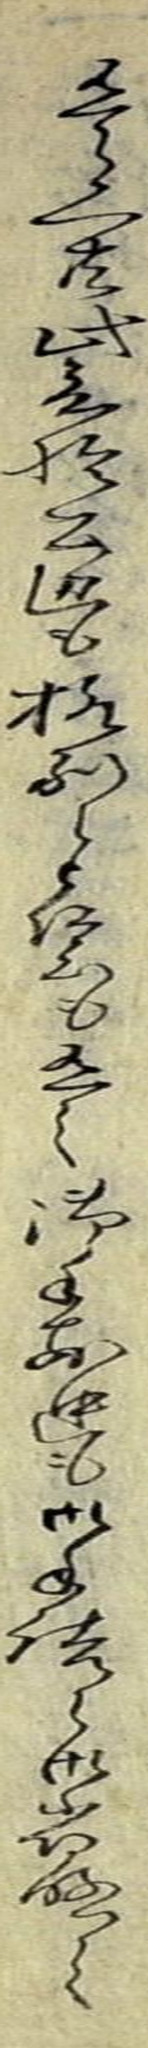有之候へ共此度於公辺も各別之被仰出も有之御手前迚も御手詰之御省略之
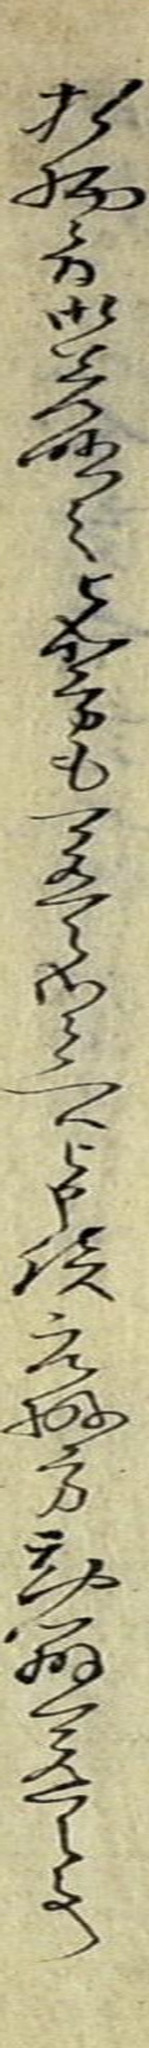折柄に付御差略之被成方も可有之哉に候へは被申談取扱方勘弁可有之候事
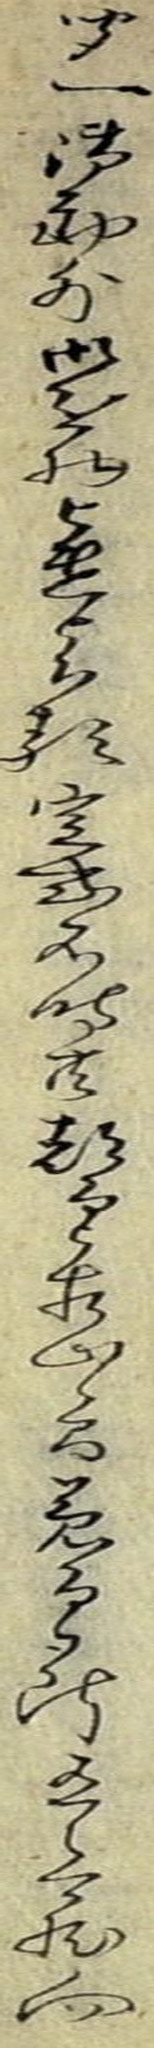聞一御勤外御進物被遣被下類定式不時共都而被相止候間兼而御断有之可然向
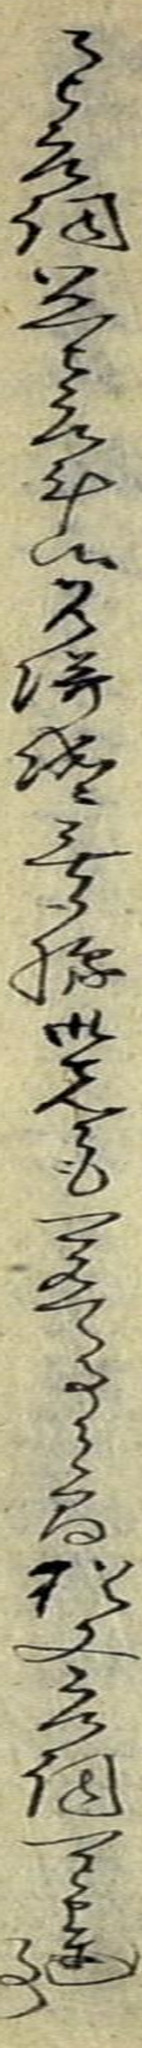に被取調宜被取斗候乍併誠に無御拠御先にも可有之事に候間猶又取調可被申達事
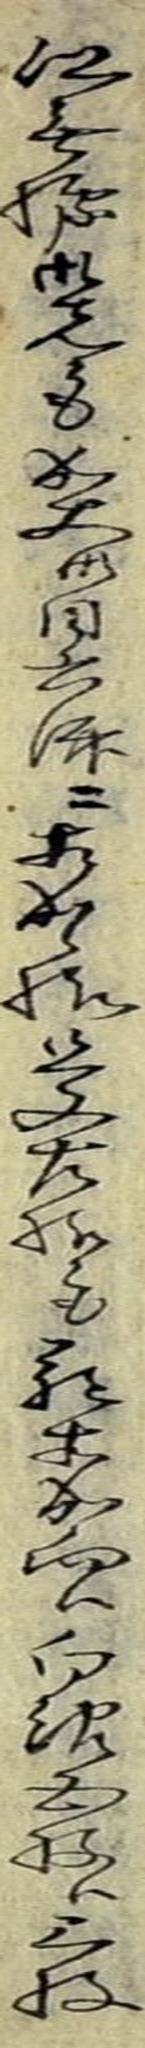聞ニナシ但無拠御先にも成丈御目六済に相成候様且又左様にも難相成向は白銀五枚は三枚
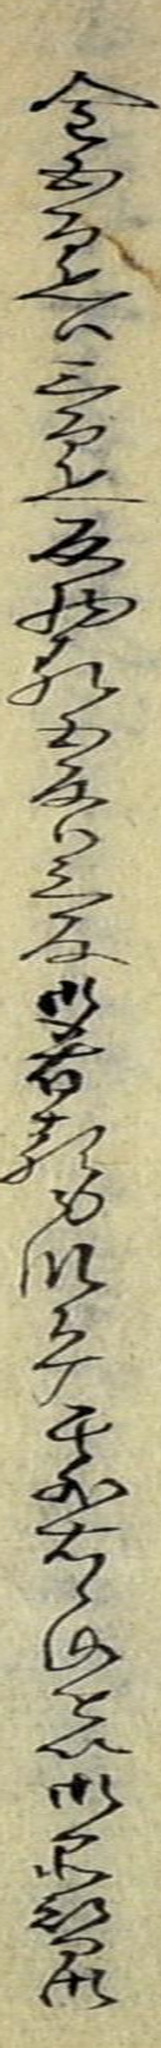金五百疋は三百疋反物類五反は三反御肴類も段下ヶ其外右之趣を以御品替御
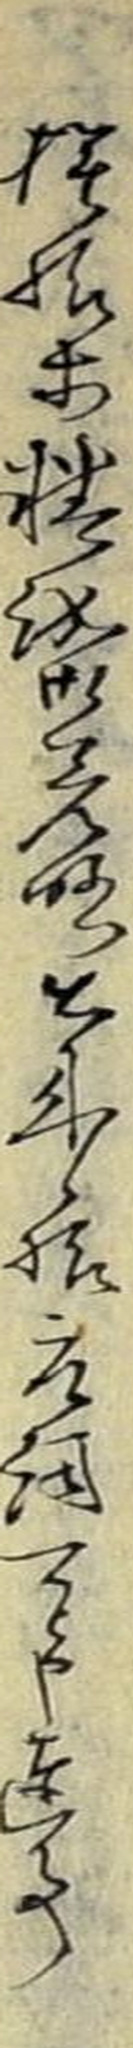模様等精誠御差略出来候様取調可被申達事
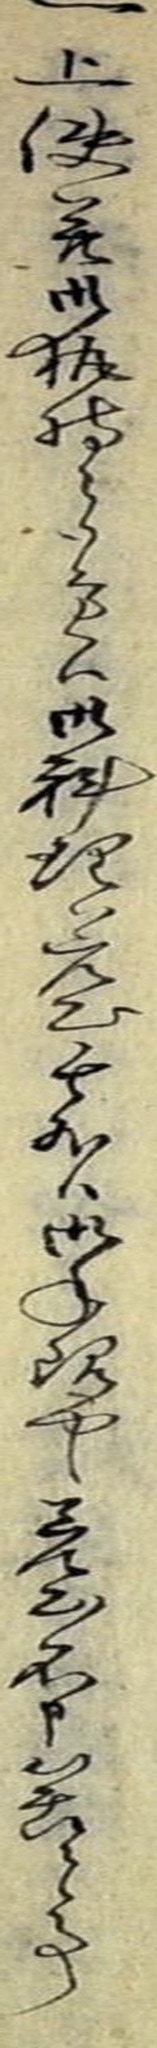奉一上使并御執持之御方へは御料理差出其外は御年限中差出不申筈候事
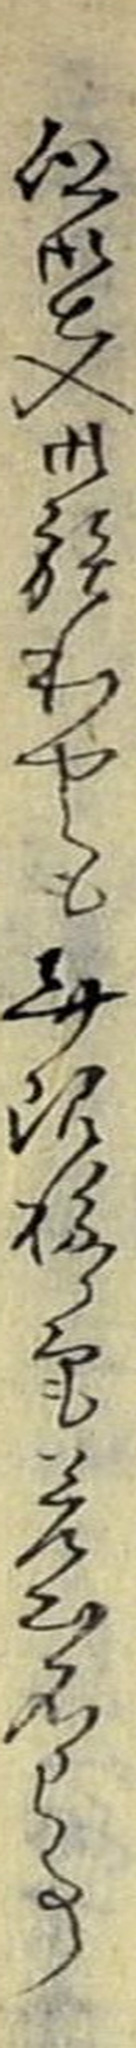但御出入御旗本中へも刻限移候而も差出不申候事
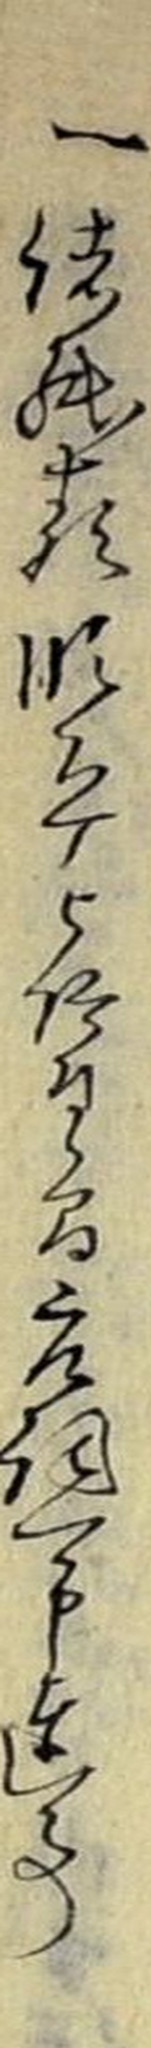一諸紙類段下ヶ被仰付候間取調可申達事
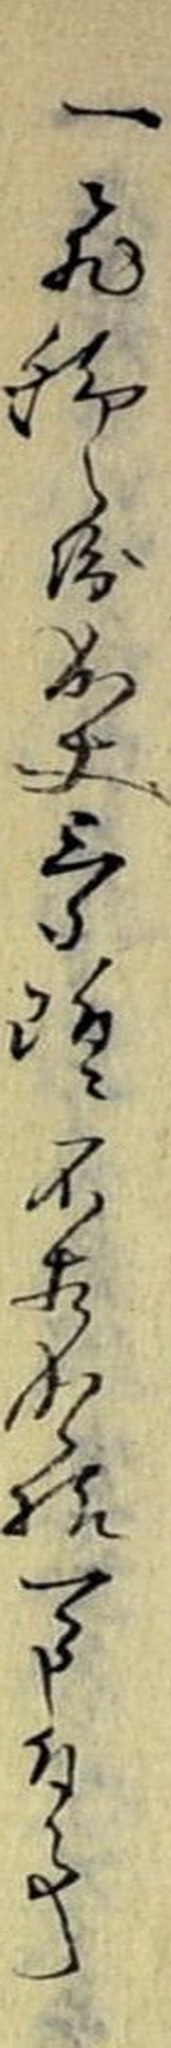一飛脚之儀成丈三ッ附に不相成候様可申事
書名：命令之部 六
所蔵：福井県文書館 Fukui Prefectural Archives
